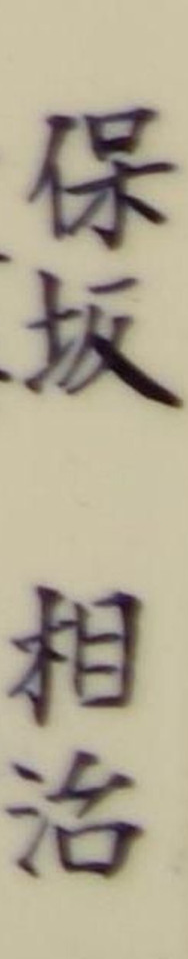保坂相治
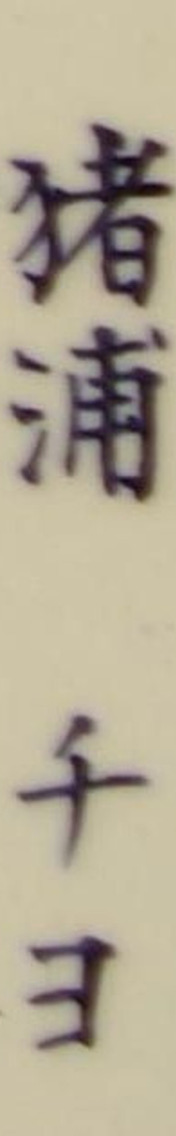猪浦チヨ
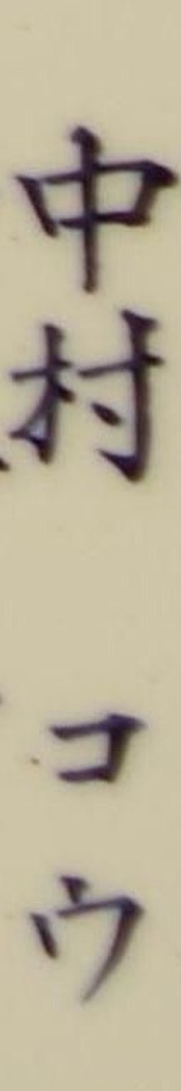中村コウ
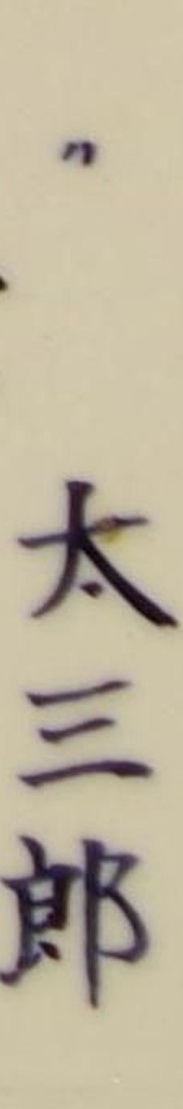太三郎
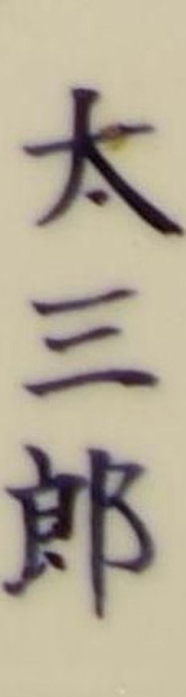太三郎
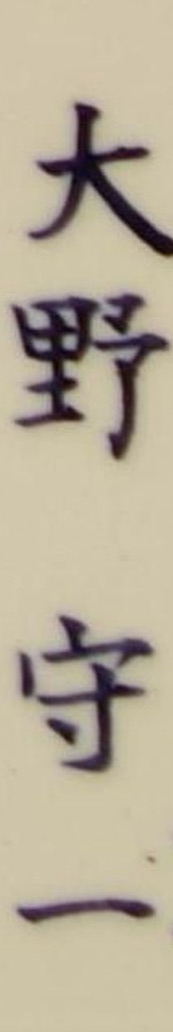大野守一
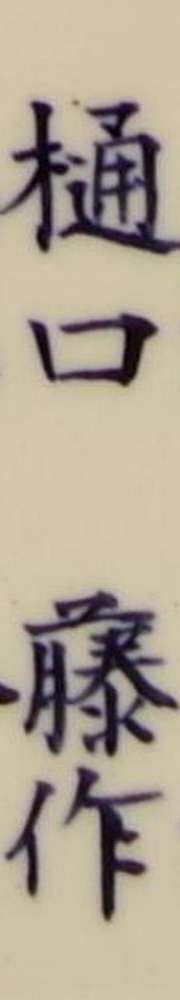樋口藤作
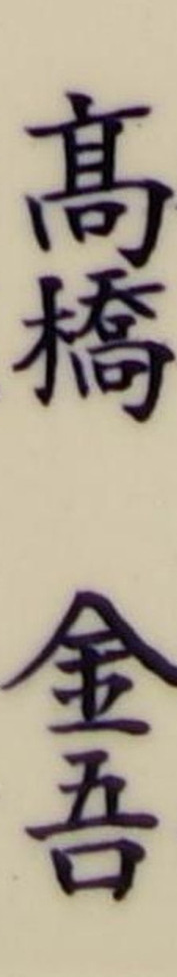高橋金吾
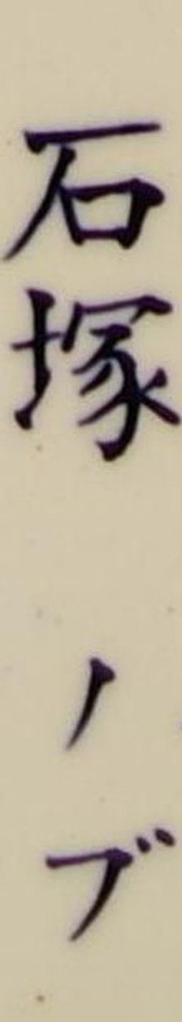石塚ノブ
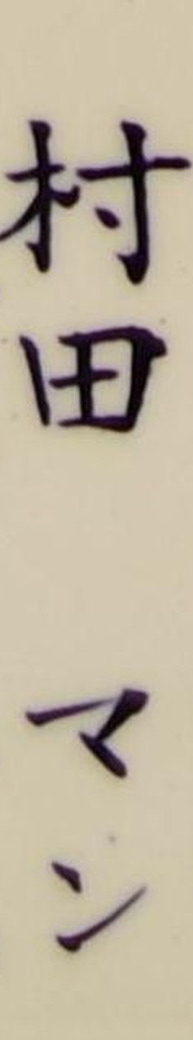村田マン
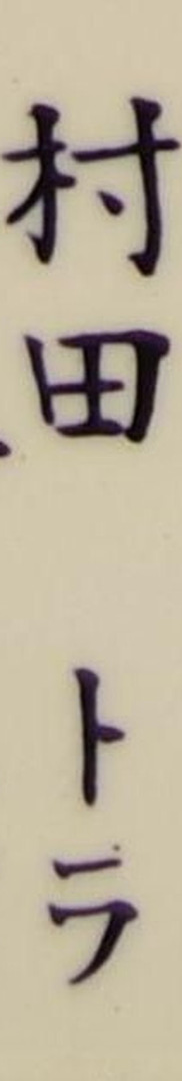村田トラ
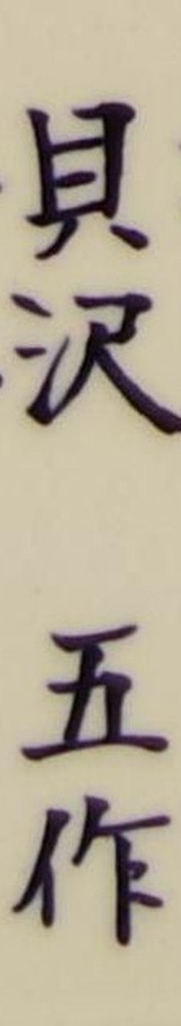貝沢五作
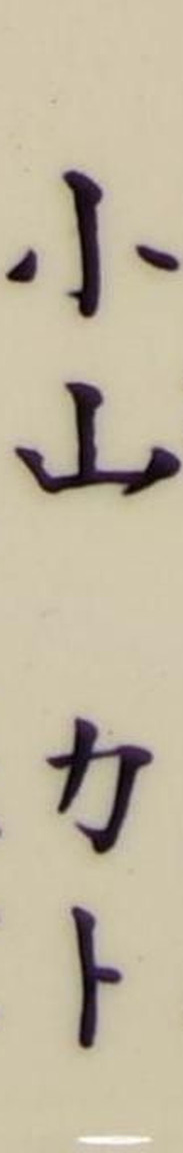小山カト
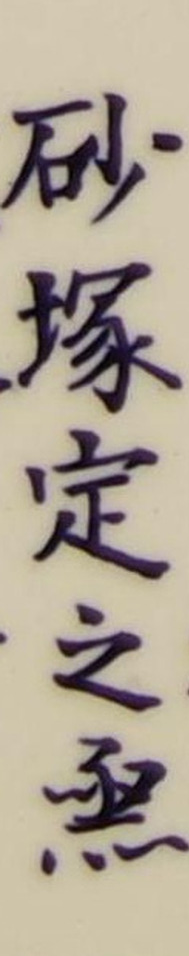砂塚定之丞
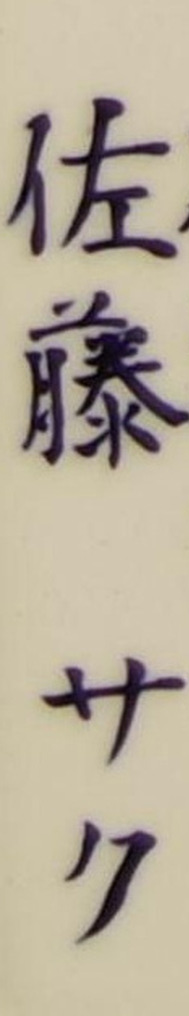佐藤サク

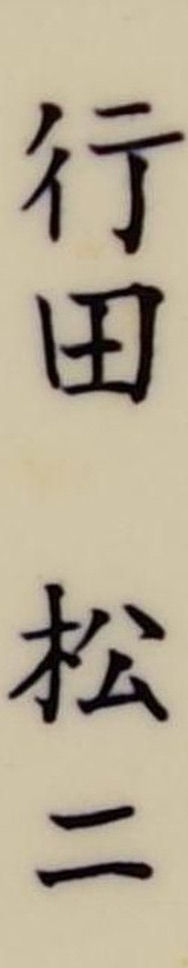行田松二
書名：E~L
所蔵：高野山金剛峯寺
